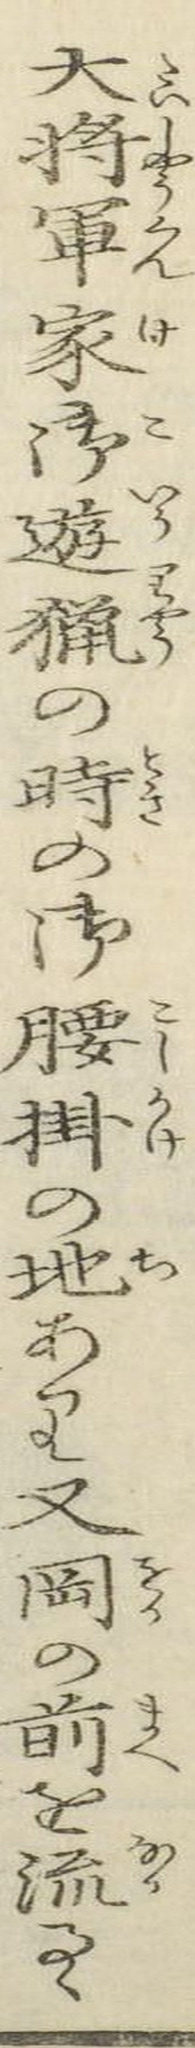大将軍家御遊猟の時の御腰掛の地あり又岡の前を流るゝ
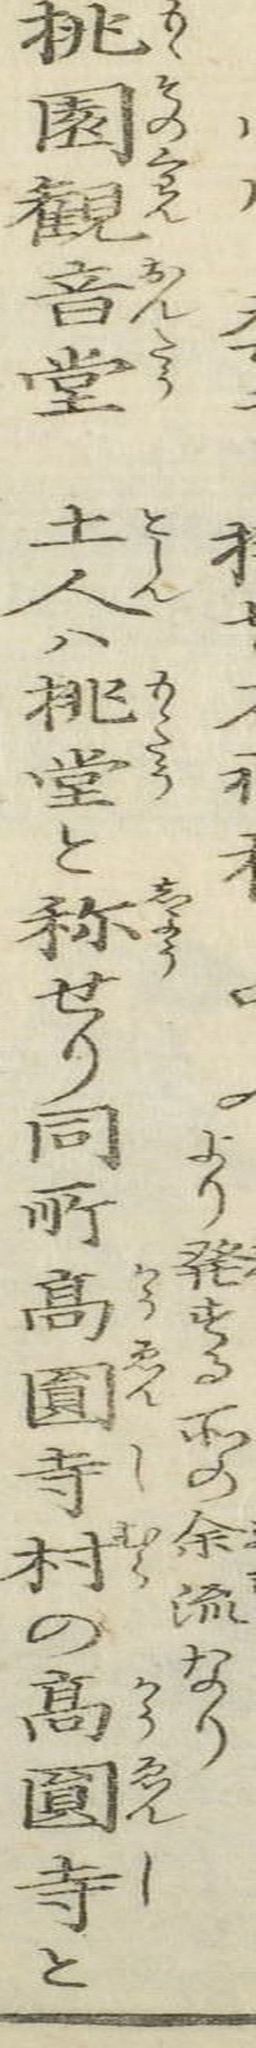桃園観音堂土人は桃堂と称せり同所高円寺村の高円寺と
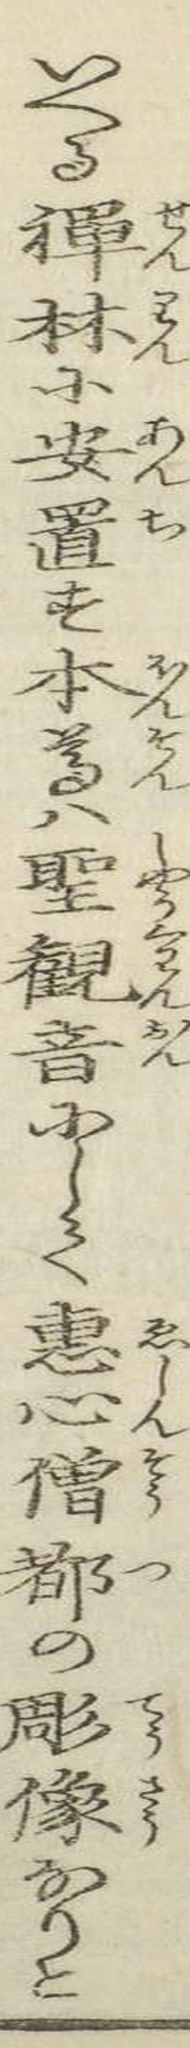いへる禅林に安置す本尊は聖観音にして恵心僧都の彫像なりと
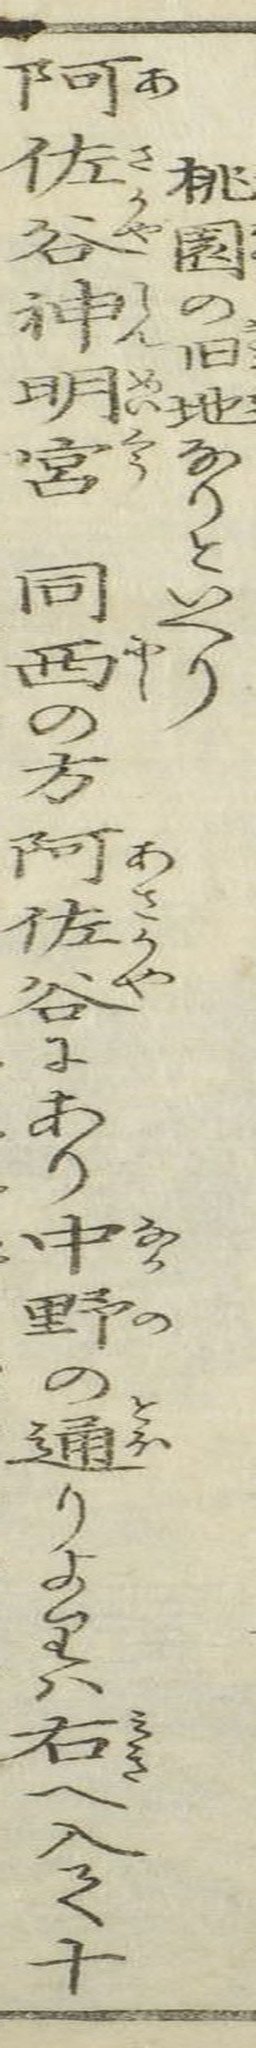阿佐谷神明宮同西の方阿佐谷にあり中野の通りよりは右へ入て十
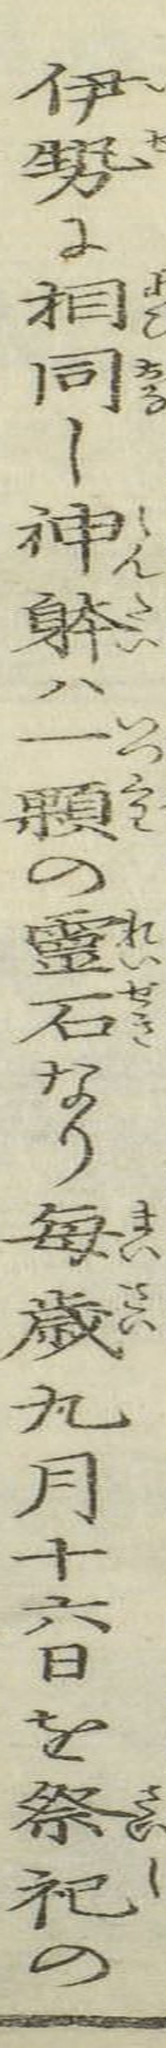伊勢に相同し神体は一顆の霊石なり毎歳九月十六日を祭祀の
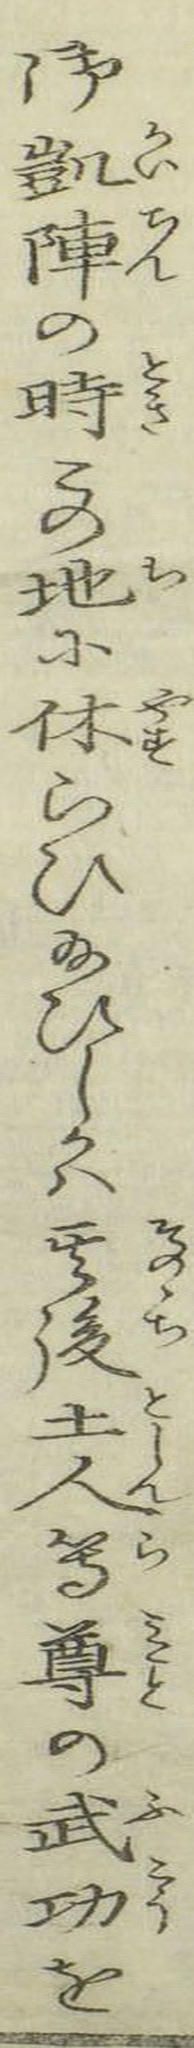御凱陣の時この地に休らひ給ひしかは其後土人等尊の武功を

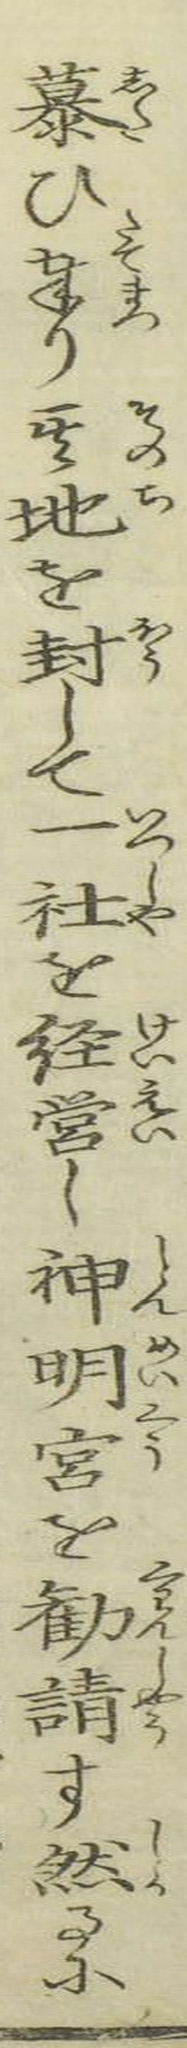慕ひ奉り其地を封して一社を経営し神明宮を勧請す然るに
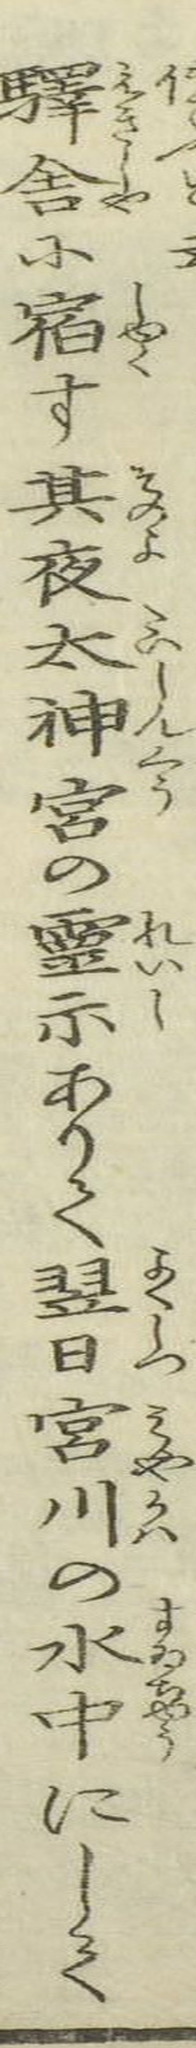駅舎に宿す其夜太神宮の霊示ありて翌日宮川の水中にして
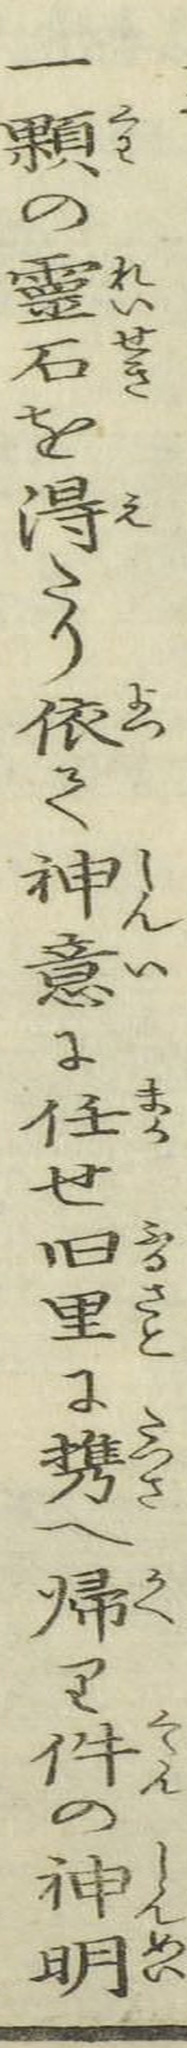一顆の霊石を得たり依て神意に任せ旧里に携へ帰り件の神明
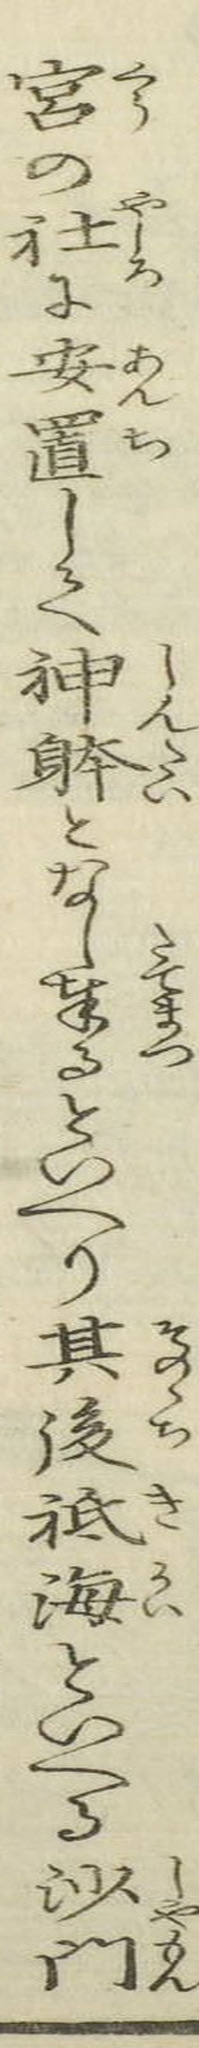宮の社に安置して神体となし奉るといへり其後祇海といへる沙門
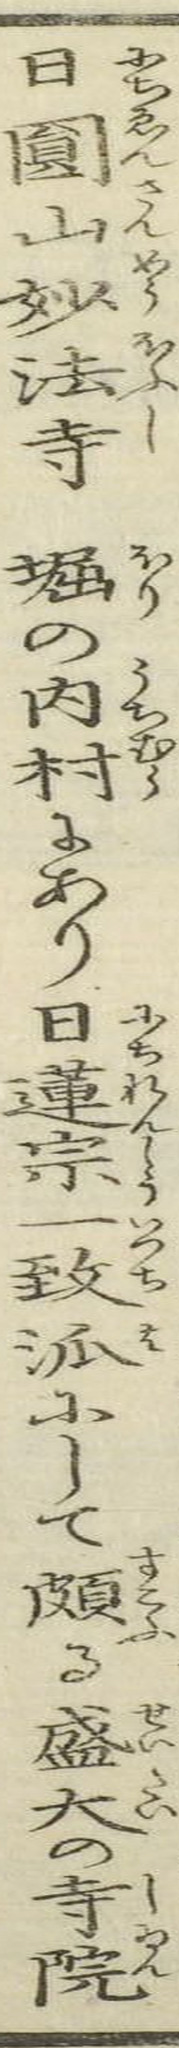日円山妙法寺堀の内村にあり日蓮宗一致派にして頗る盛大の寺院
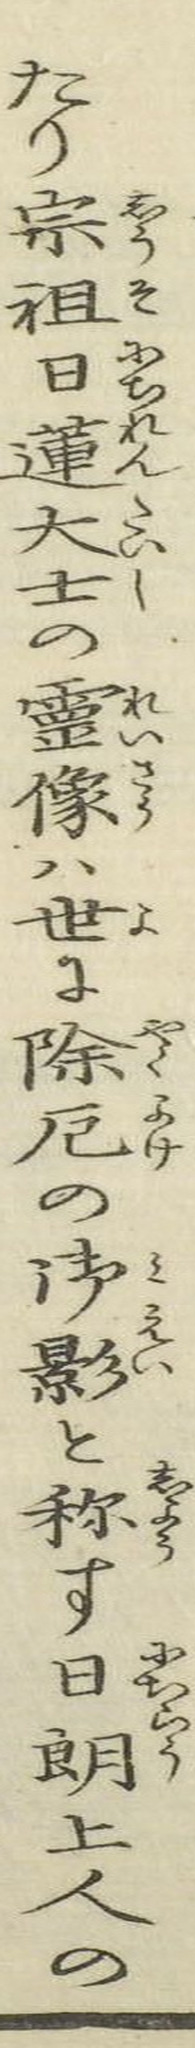たり宗祖日蓮大士の霊像は世に除厄の御影と称す日朗上人の
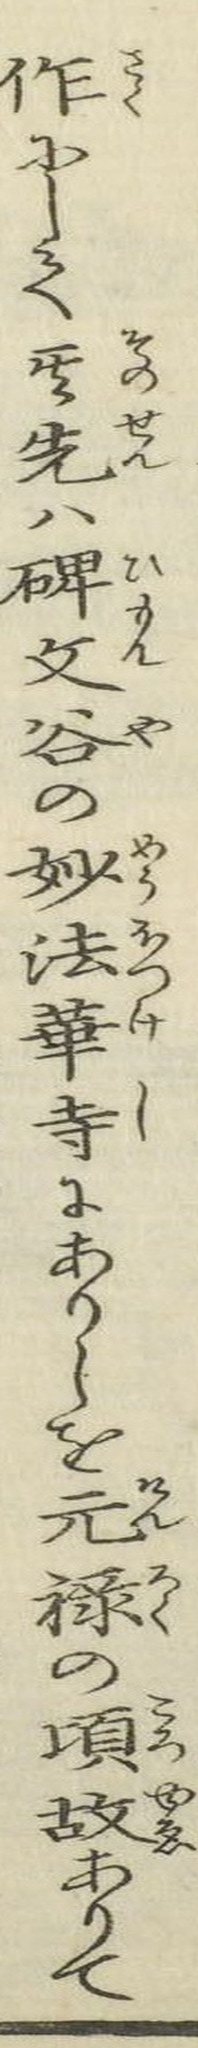作にして其先は碑文谷の妙法華寺にありしを元禄の頃故ありて
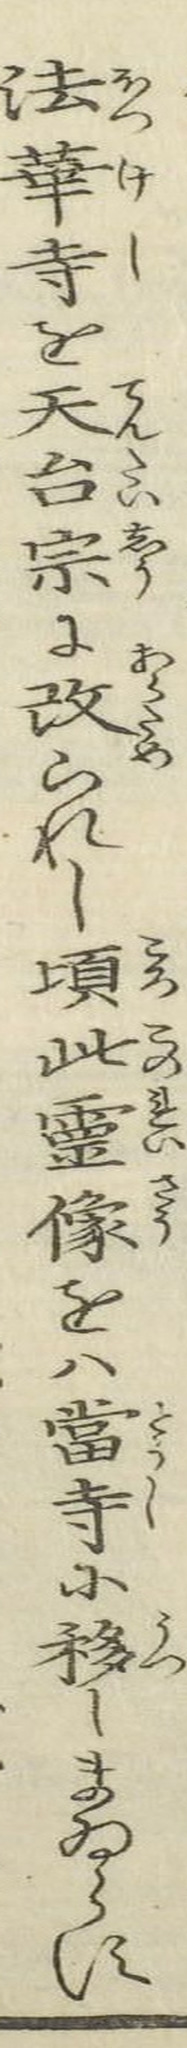法華寺を天台宗に改られし頃此霊像をは当寺に移しまゐらす
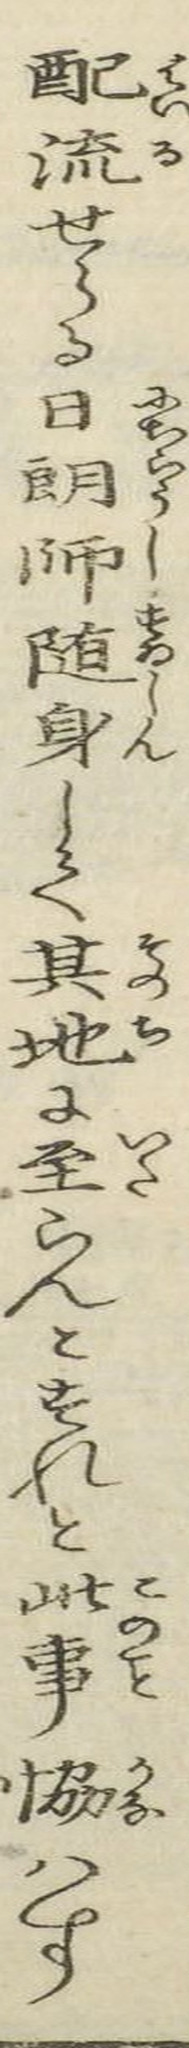配流せらる日朗師随身して其地に至らんとすれと此事協はす
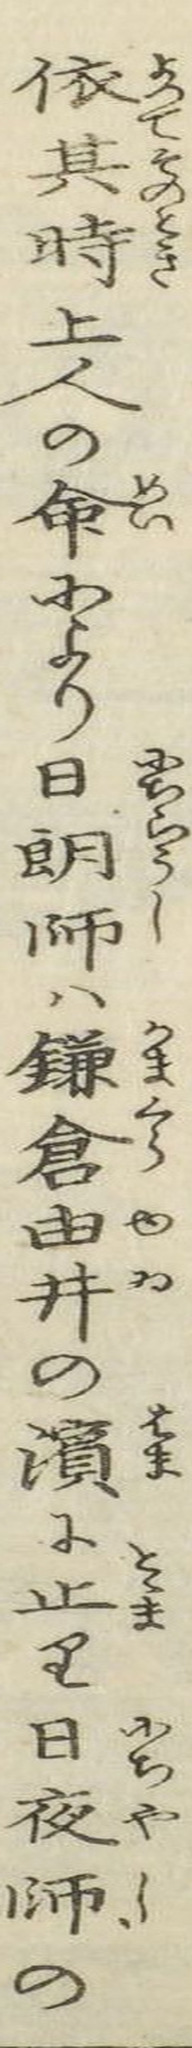依其時上人の命により日朗師は鎌倉由井の浜に止り日夜師の
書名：江戸名所図会 20巻 巻之11
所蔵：東京学芸大学教育コンテンツアーカイブ
